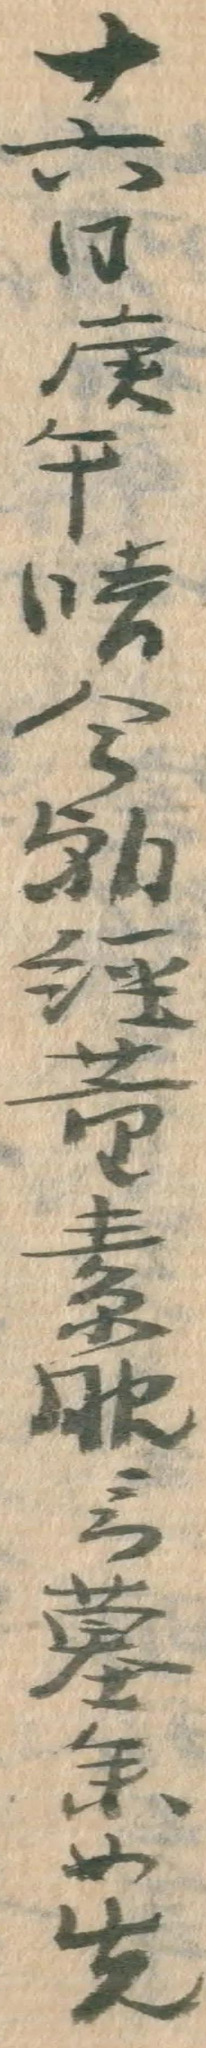十六日庚午晴、今朝経董素服ニ而墓参、如先
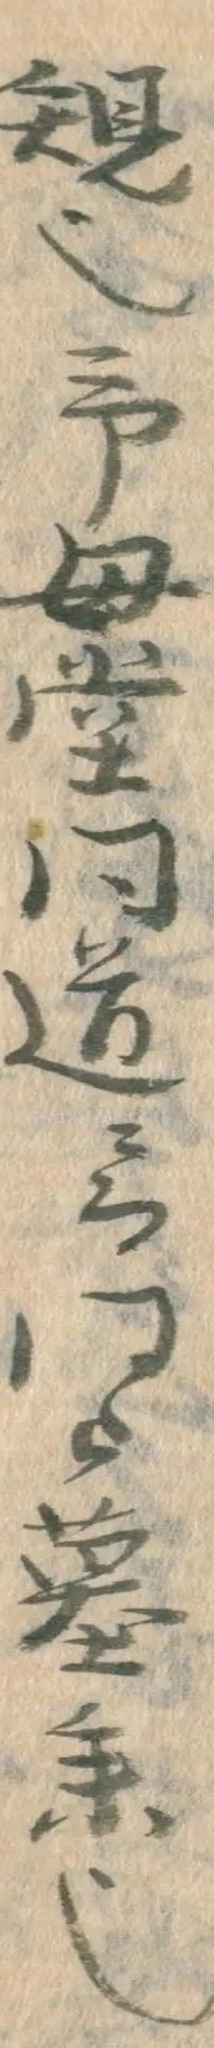規也、予・母堂同道ニ而同日墓参也、
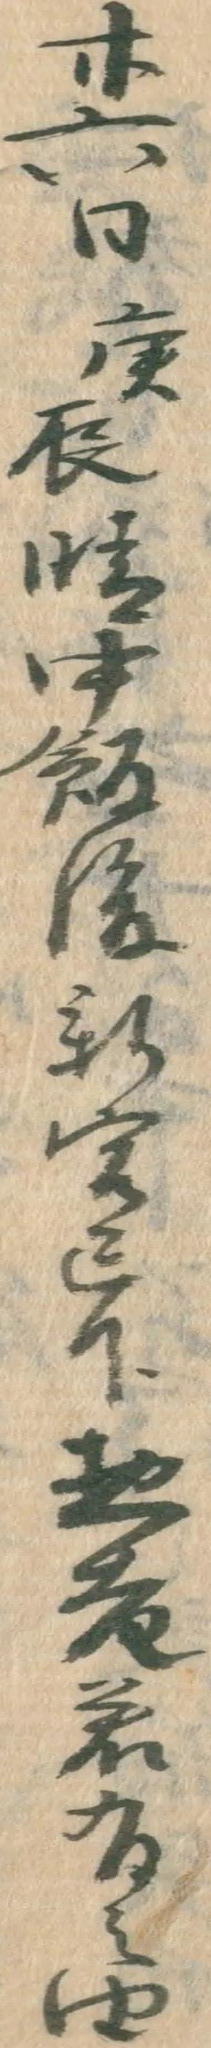廿六日庚辰晴、中飯後新宮已下惣老若有之由
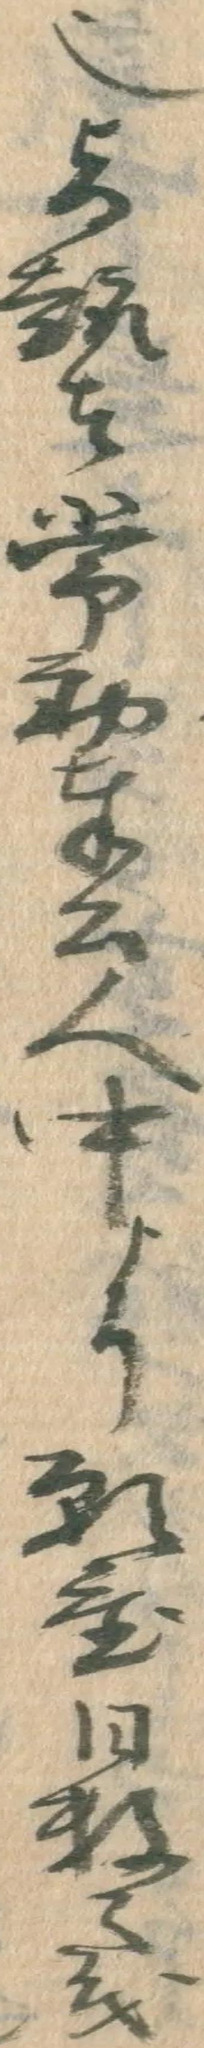也、旨趣者常勤奉公人中より願置日数之義

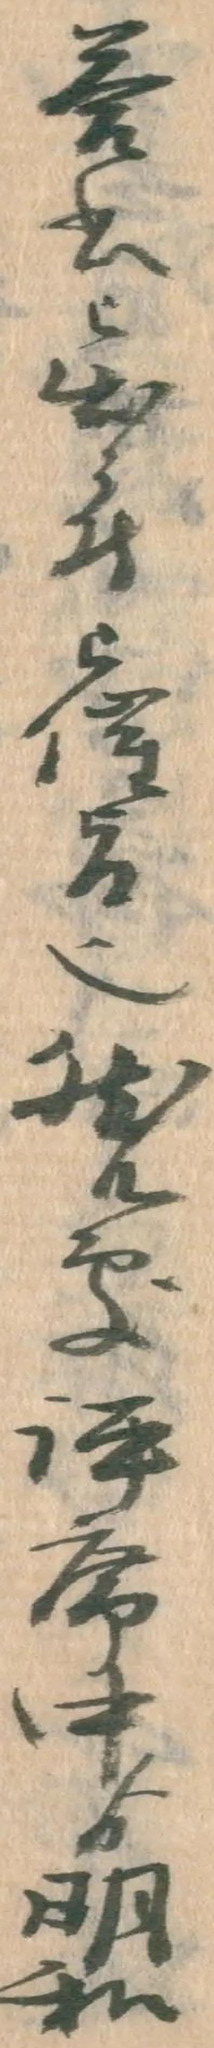答書被出ニ付、被催旨也、然ル處、評席中ゟ明和
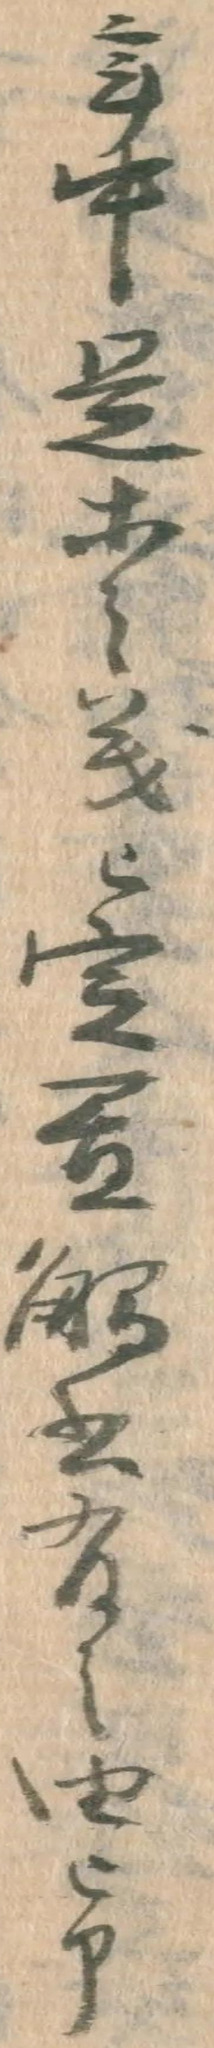年中是等之義被定置触書有之由被申
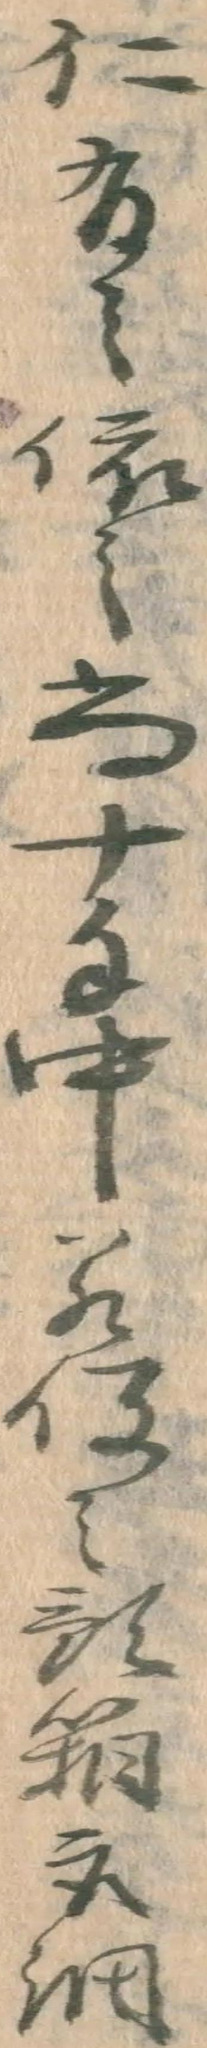仁有之、依之、尚十手中若役之預箱取調
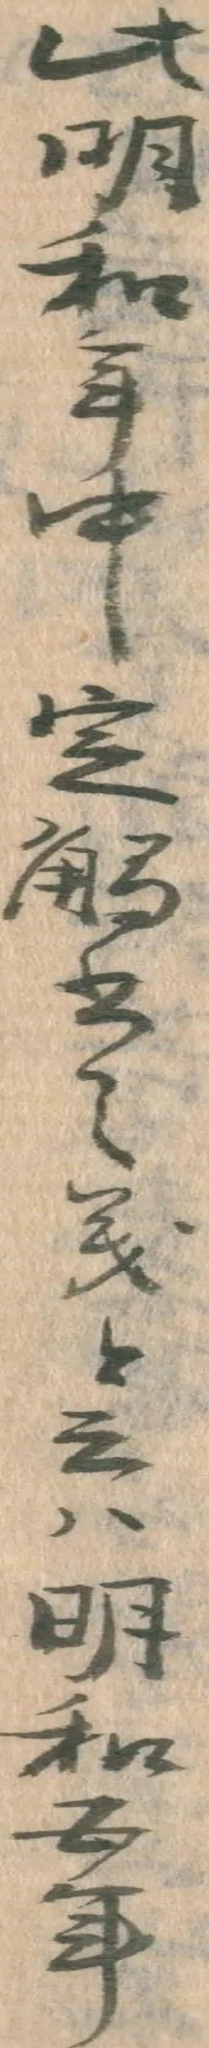此明和年中定触書之義と云ハ、明和五年
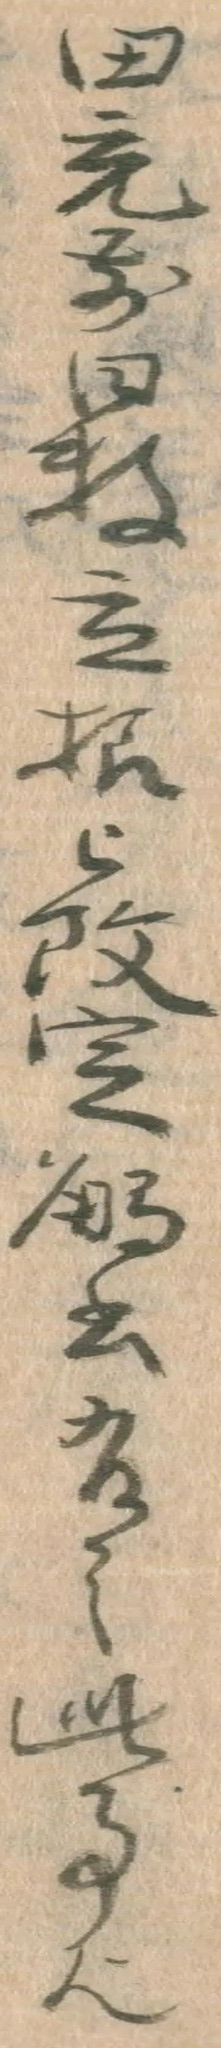田充前日数立様被改定触書有之、此事尤
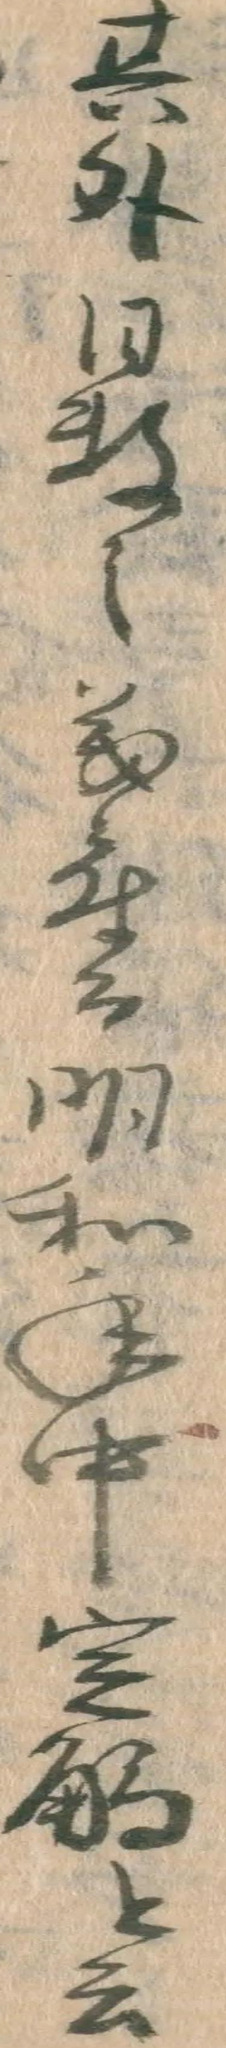其外日数之義ニ付而、明和年中定触と云
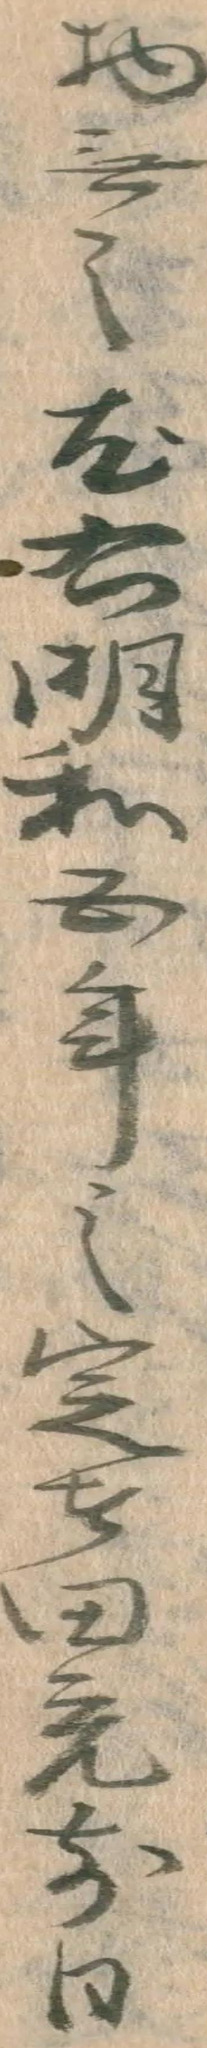物無之、尤右明和五年之定を田充前日
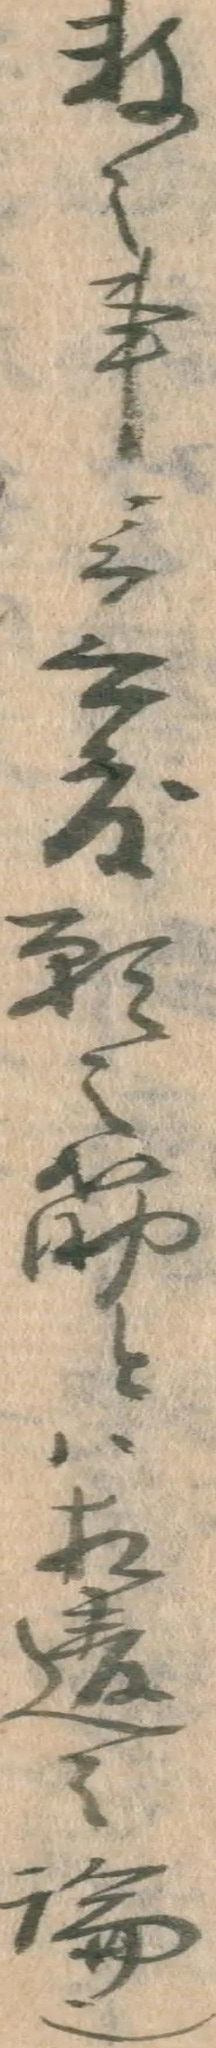数之事ニ而、今度願之筋とハ相違之論也、
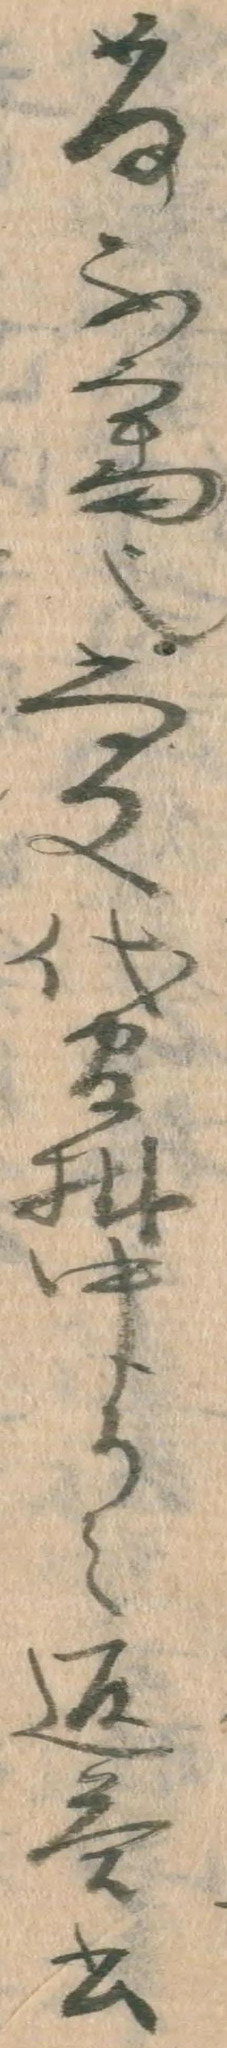如何不審也、尚又代官掛中より之返答書
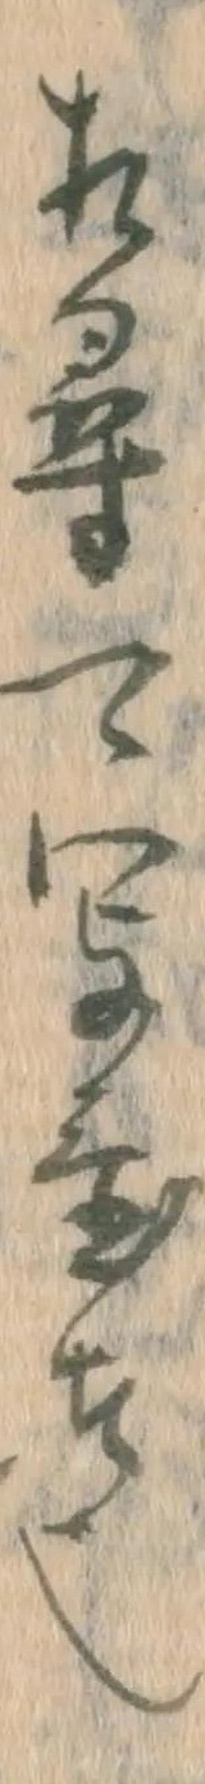相尋可写置事也、
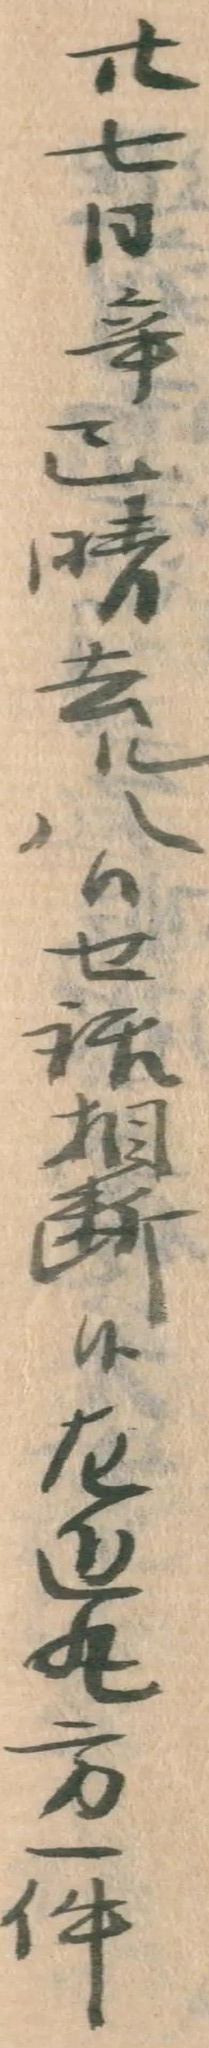廿七日辛巳晴、去ル八日世話相断候左近丸方一件、
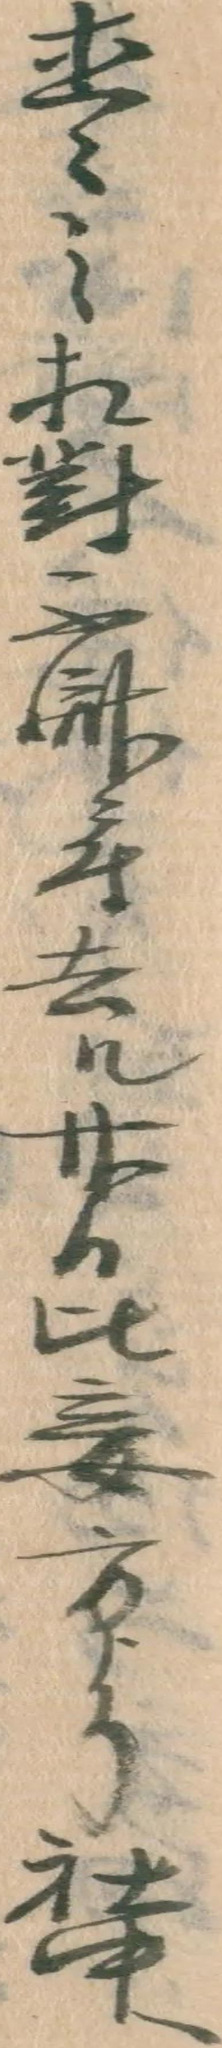直々之相對不済ニ付、去ル廿日比、妾方より社中へ
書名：賀茂社記録. 第63冊
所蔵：国立国会図書館 National Diet Library, JAPAN
